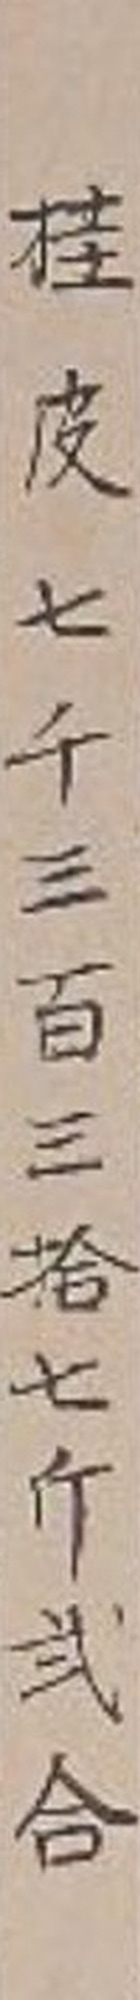桂皮七千三百三拾七斤弐合
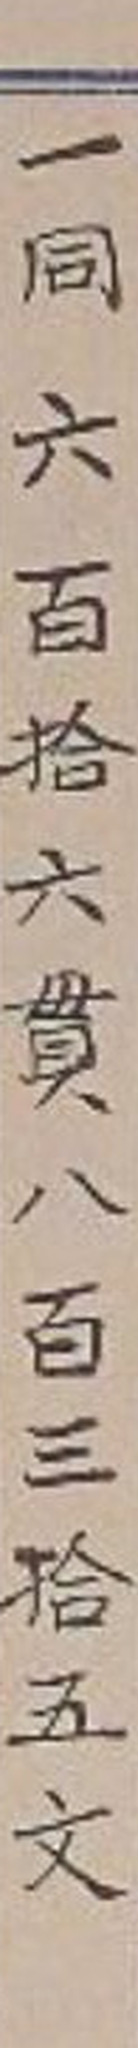一同六百拾六貫八百三拾五文
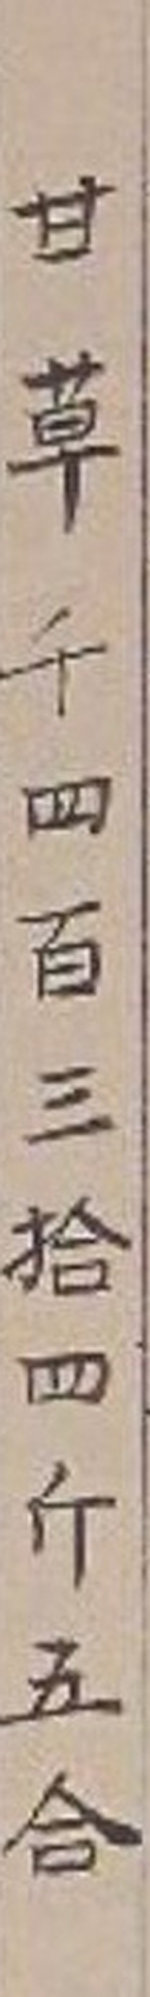甘草千四百三拾四斤五合
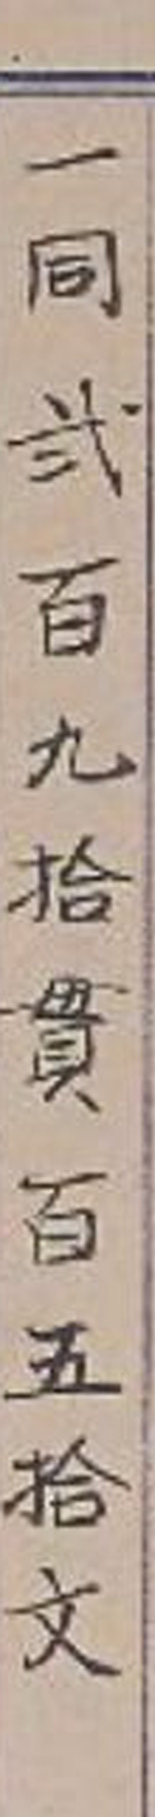一同弐百九拾貫百五拾文
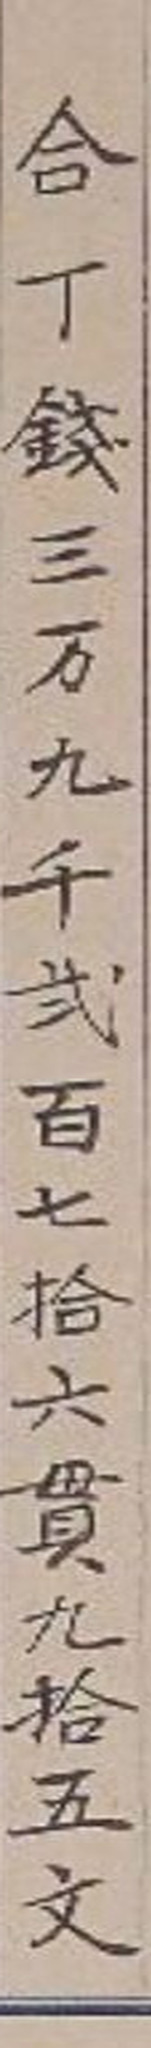合丁錢三万九千弐百七拾六貫九拾五文

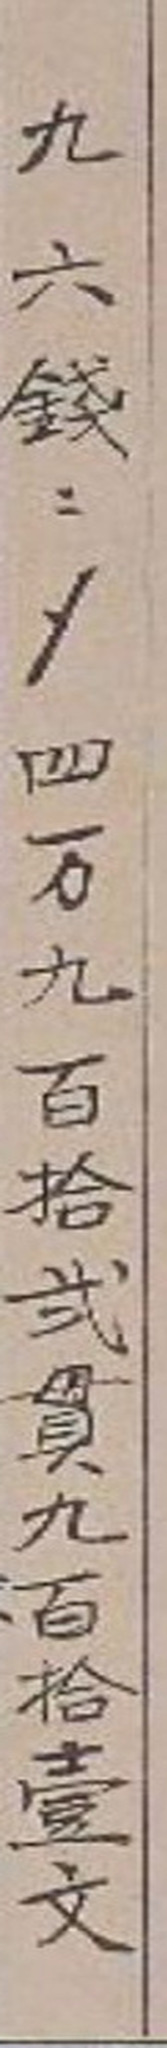九六錢ニシテ四万九百拾弐貫九百拾壹文
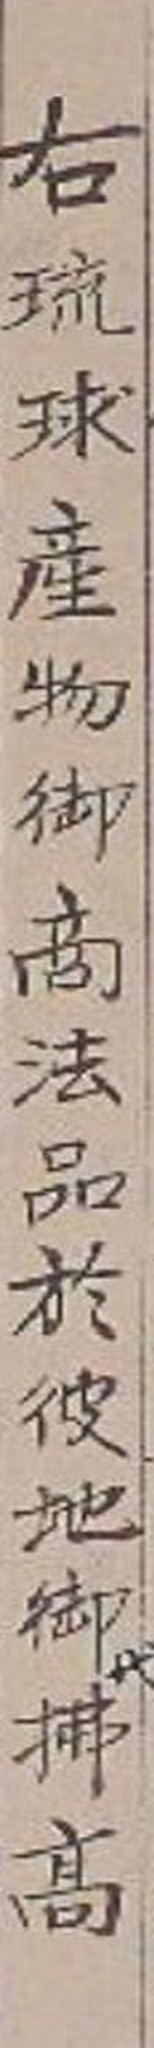右琉球産物御商法品於彼地御代拂髙
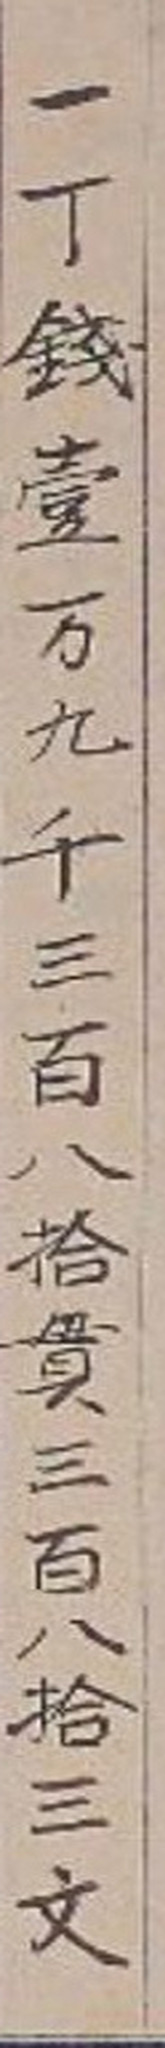一丁錢壹万九千三百八拾貫三百八拾三文
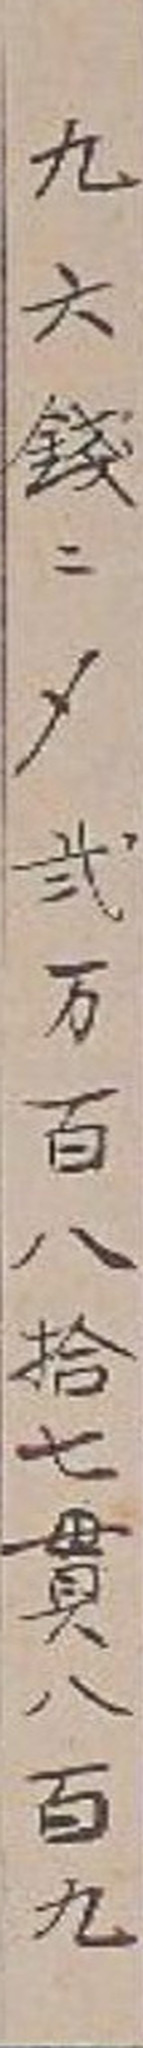九六錢ニシテ弐万百八拾七貫八百九
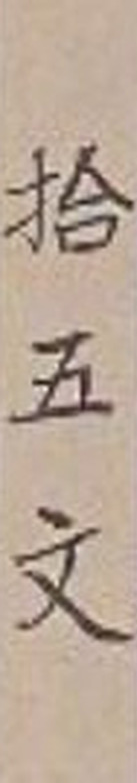拾五文
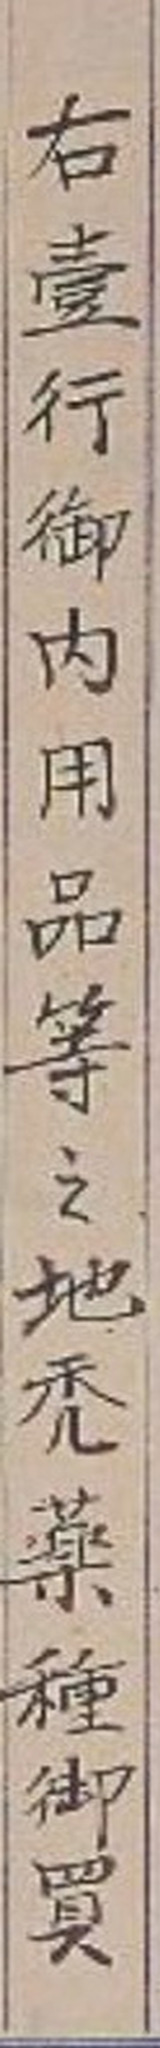右壹行御内用品等之地禿薬種御買
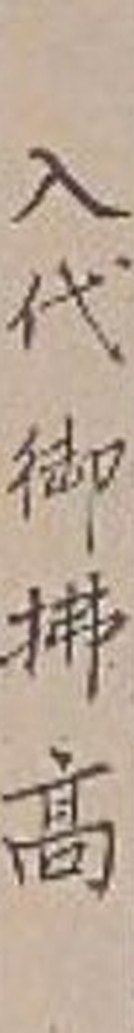入代御拂髙
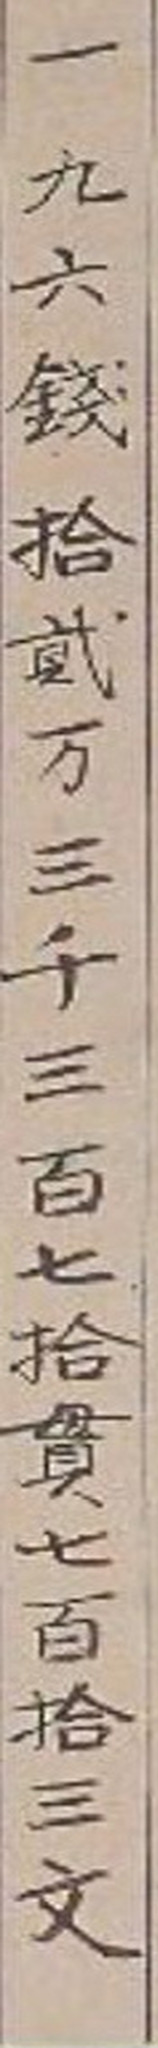一九六錢拾貳万三千三百七拾貫七百拾三文
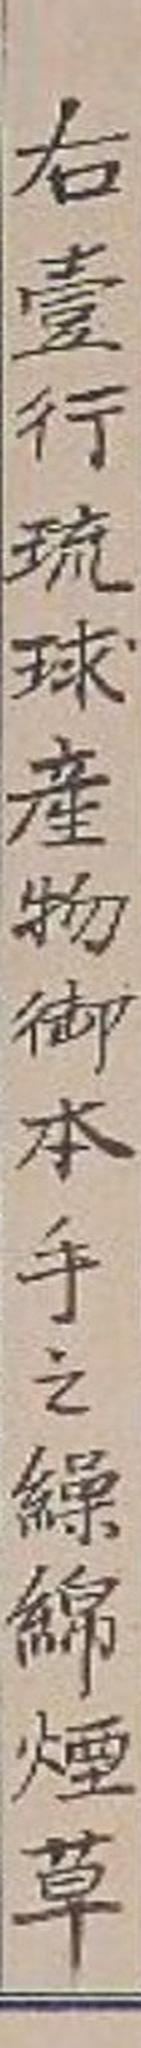右壹行琉球産物御本手之繰綿煙草
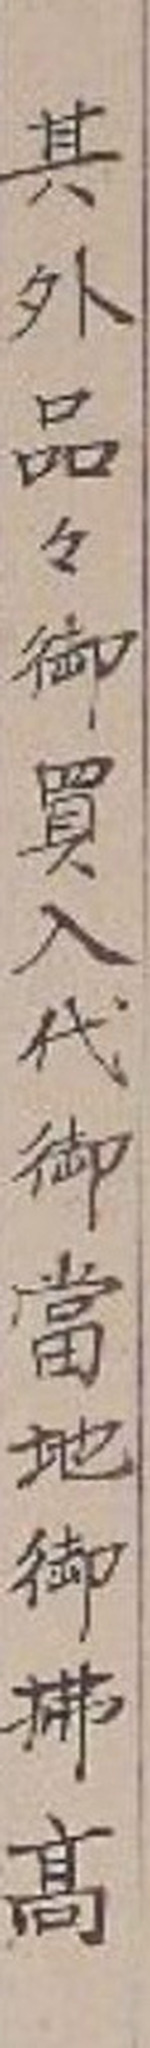其外品々御買入代御當地御拂髙
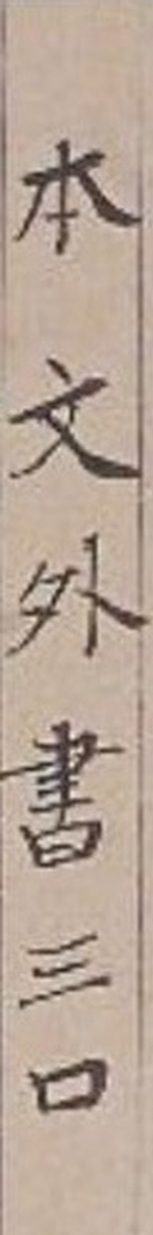本文外書三口
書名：琉球産物於長崎拂立並本手品利潤総帖 弘化四年より酉年迄
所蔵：University of the Ryukyus Library
